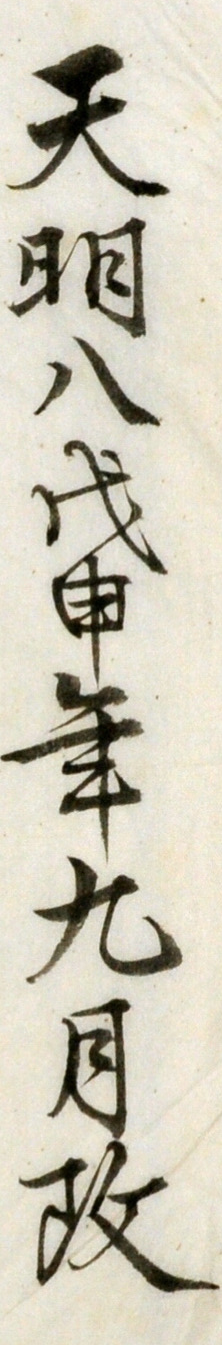天明八戌申年九月政
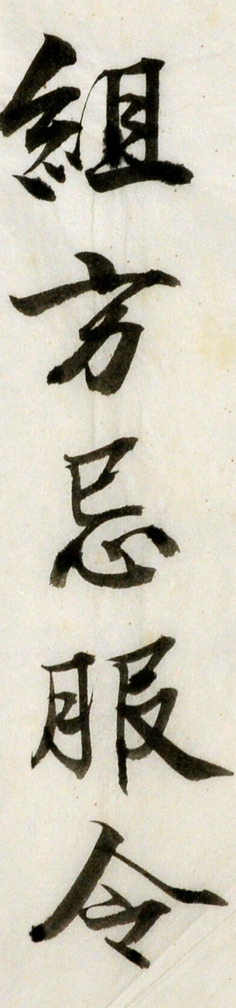組方忌服令
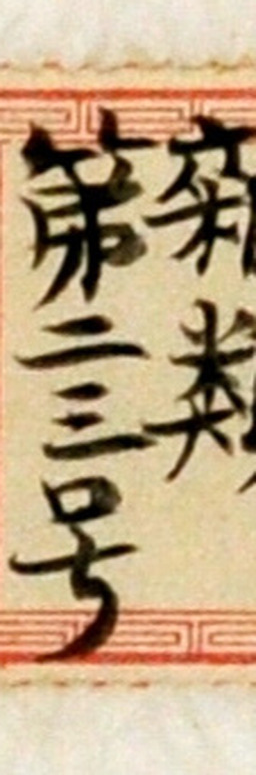第三三号

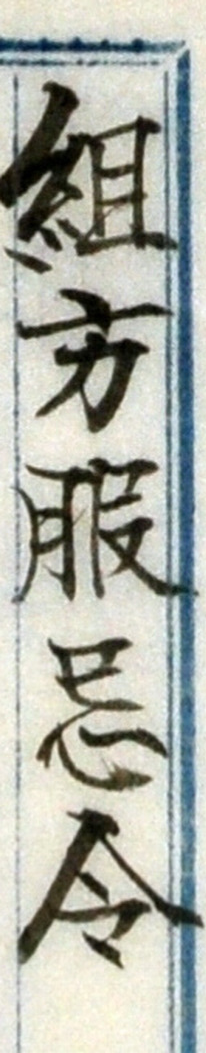組方服忌令
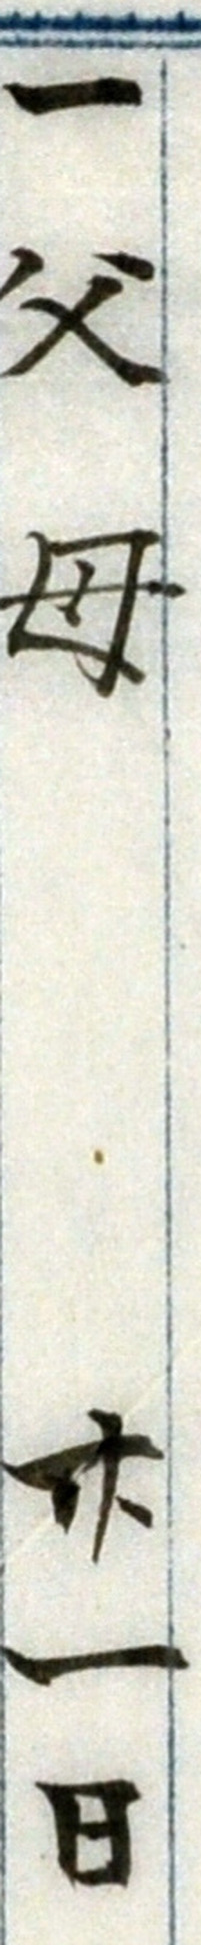一父母三十一日
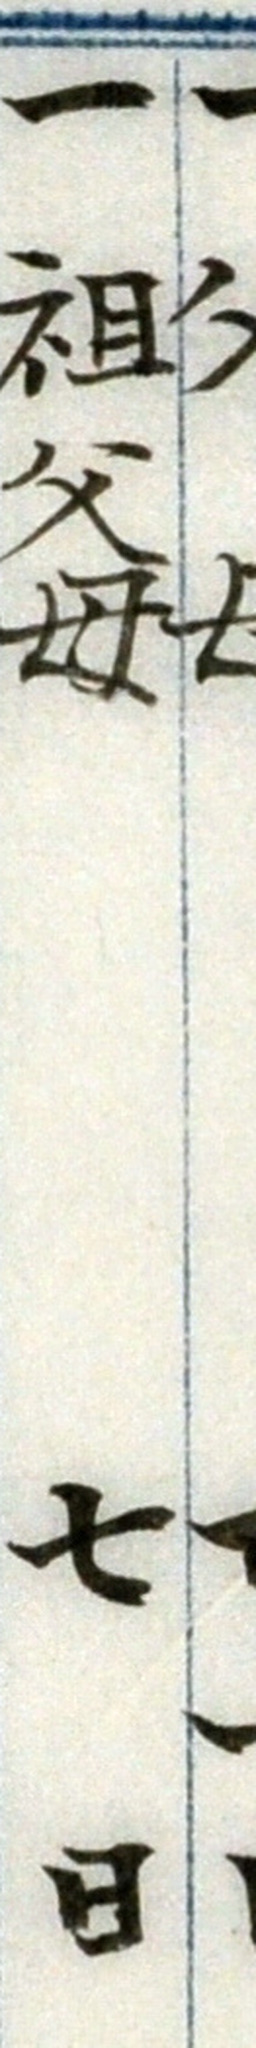一祖父母七日
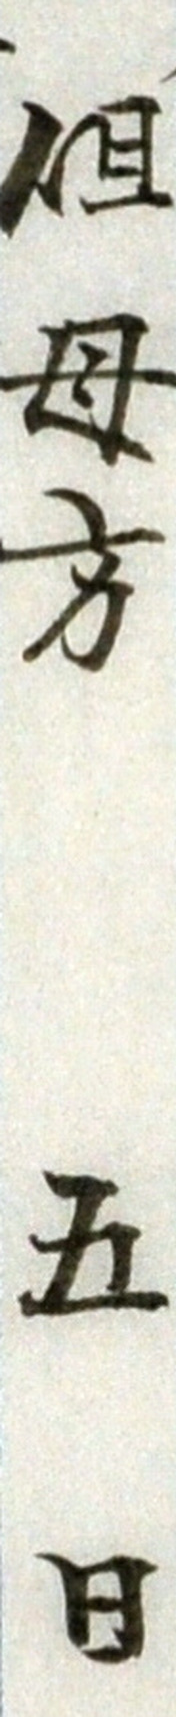但母方五日
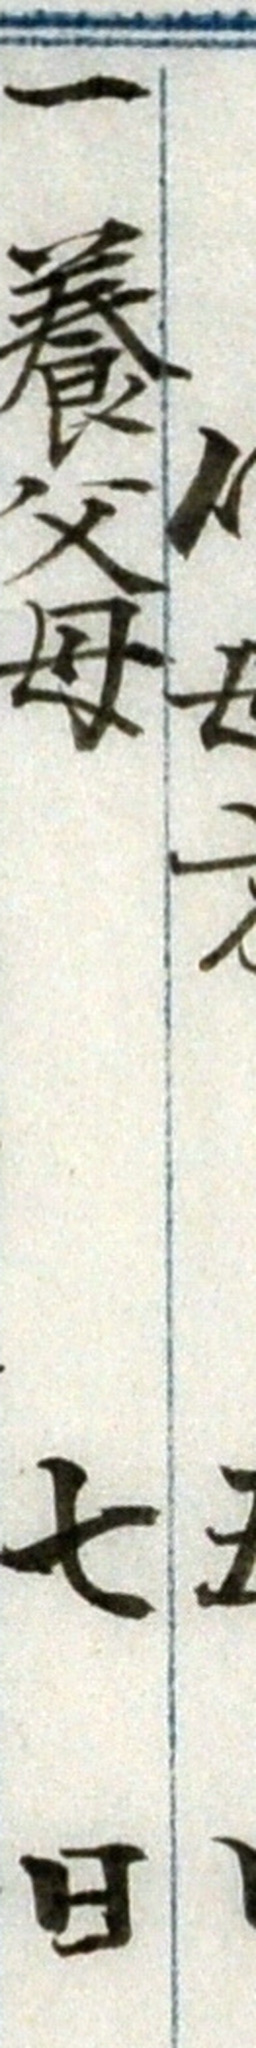一養父母七日
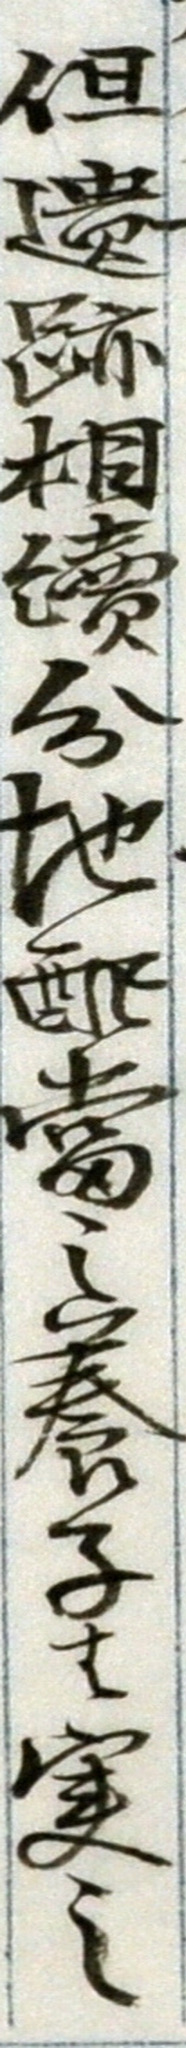但遺跡相続分地配当し養子は実之
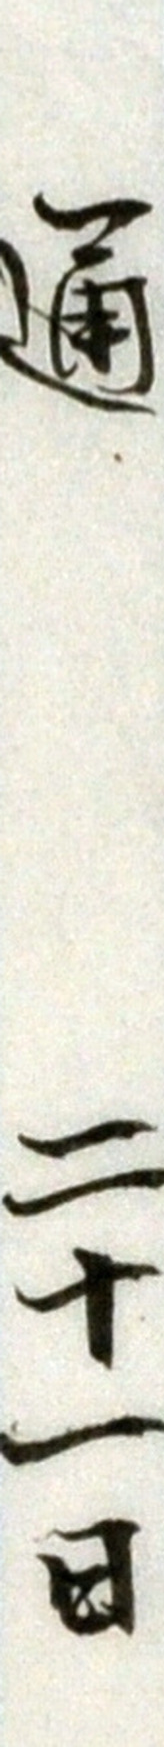通二十一日
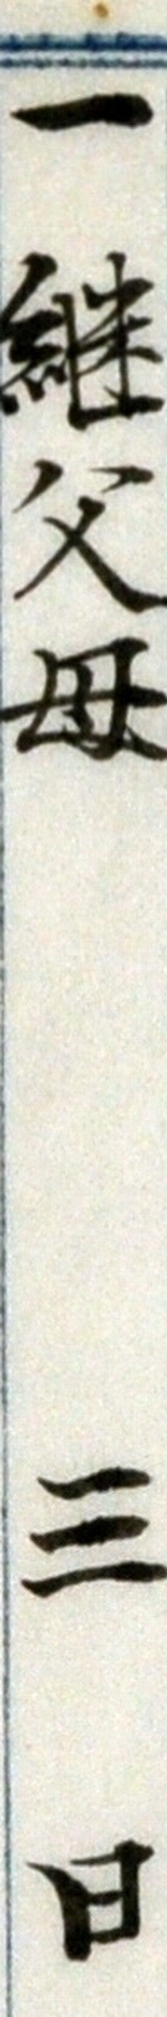一継父母三日
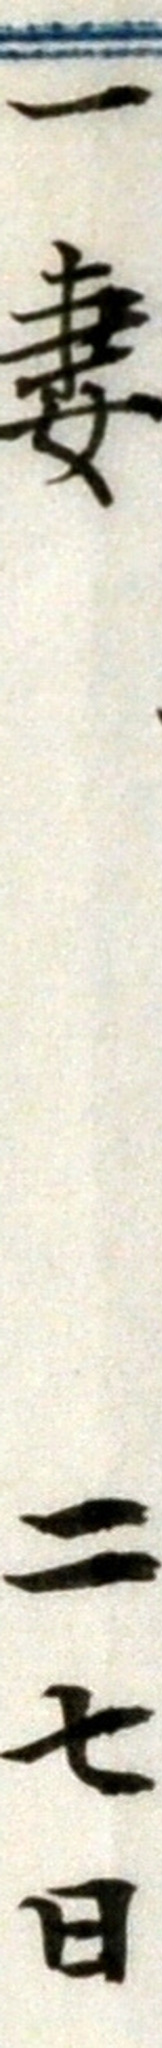一妻二七日
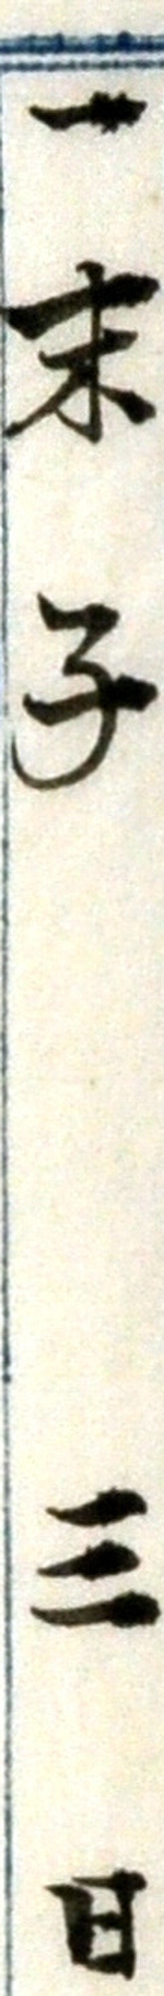一末子三日

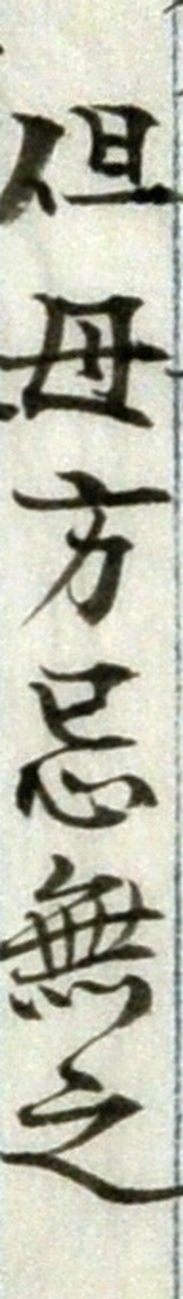但母方忌無之
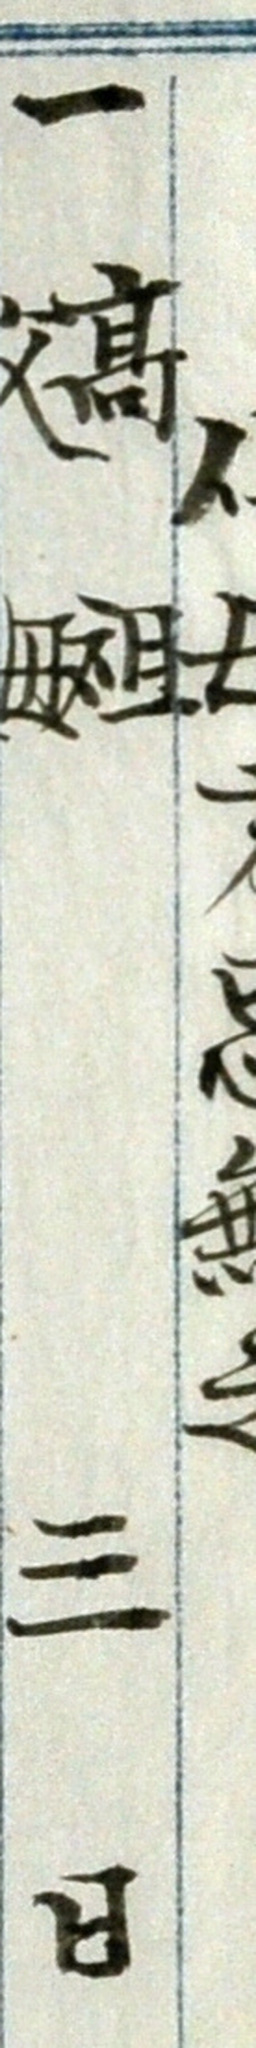一嫡孫三日
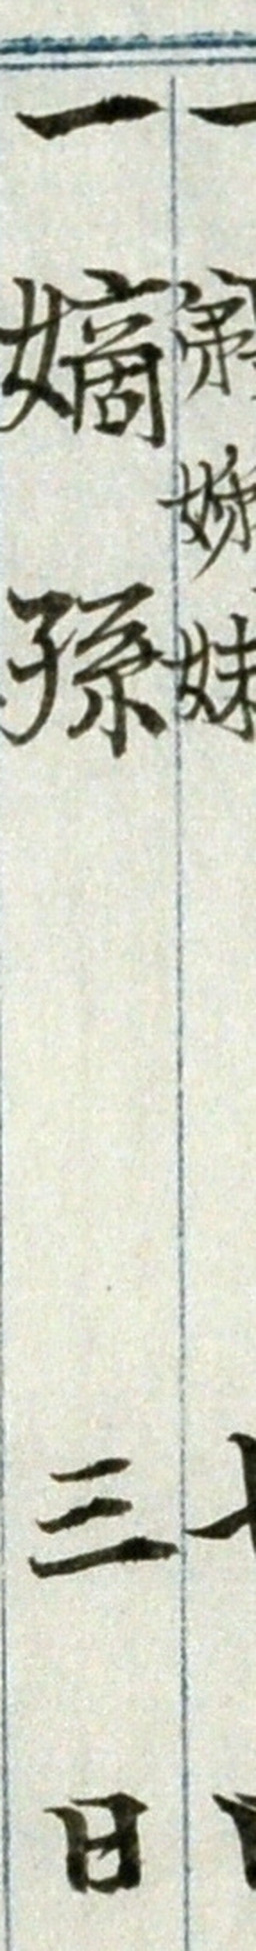一嫡孫三日
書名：組方忌服令
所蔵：伊那市立高遠町図書館・合同会社AMANE
